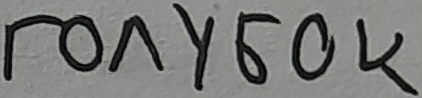голубок
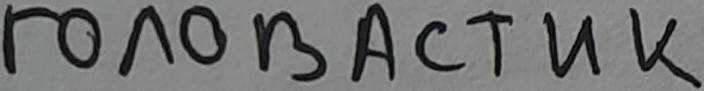головастик
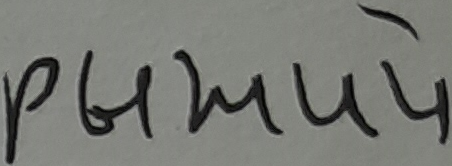рыжий
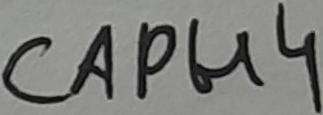сарыч
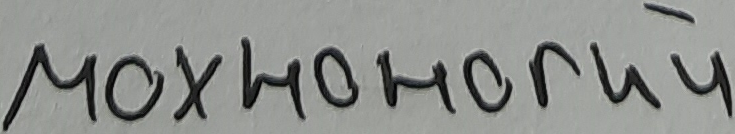мохноногий
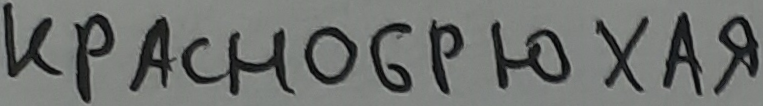краснобрюхая
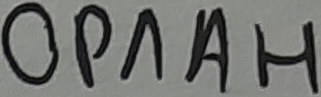орлан
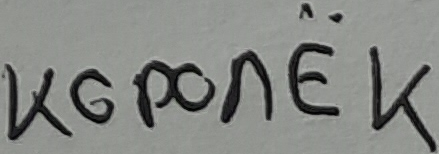королёк
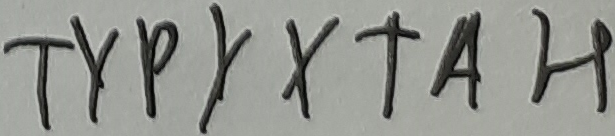турухтан
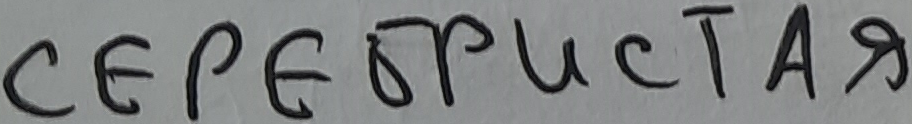серебристая
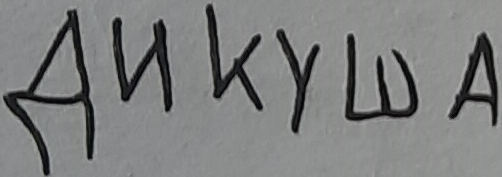дикуша
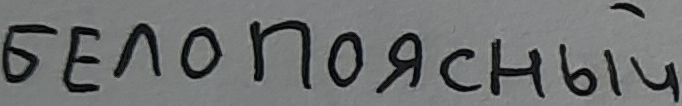белопоясный
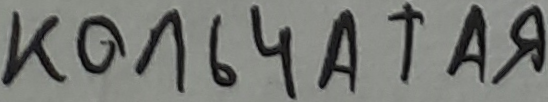кольчатая
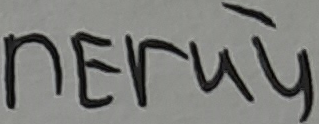пегий
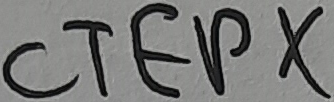стерх
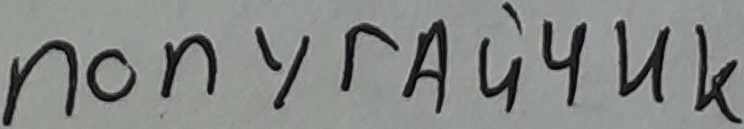попугайчик
